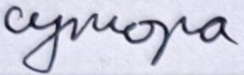сутора
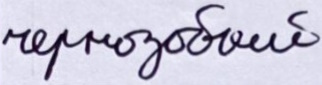чернозобый
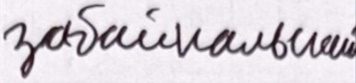забайкальский
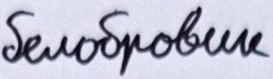белобровик
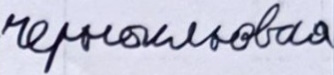черноклювая
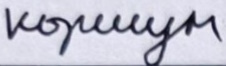коршун
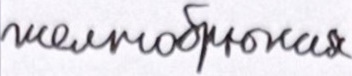желтобрюхая
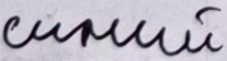синий
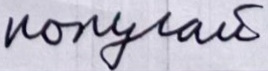попугай
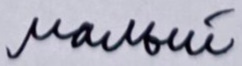малый
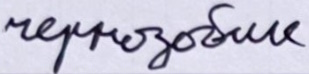чернозобик
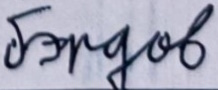бэрдов
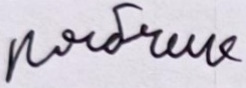рябчик
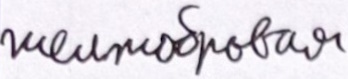желтобровая
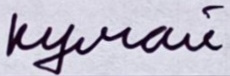кумай
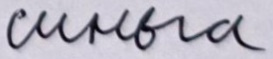синьга
